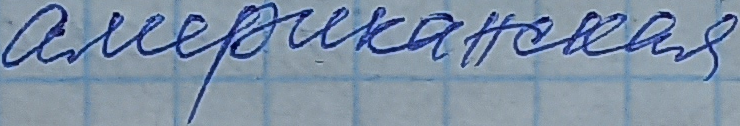американская
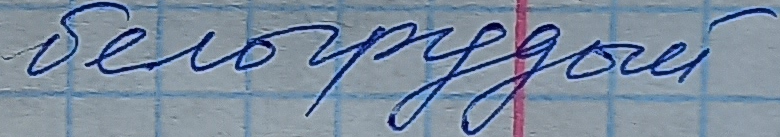белогрудый
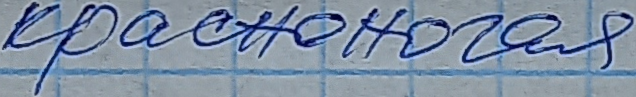красноногая
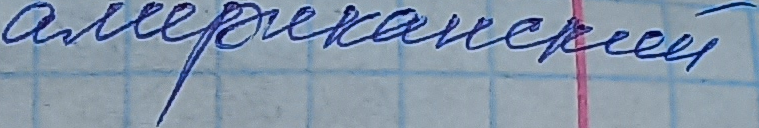американский
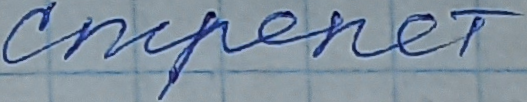стрепет
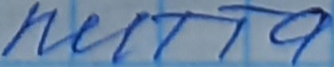питта
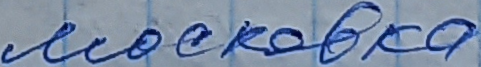московка
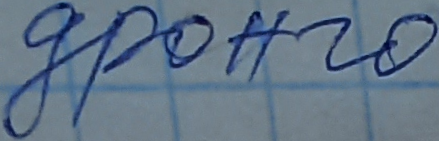дронго
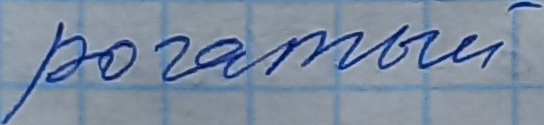рогатый
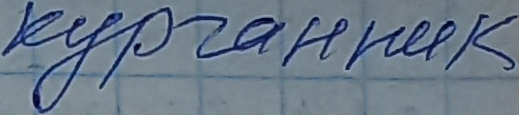курганник
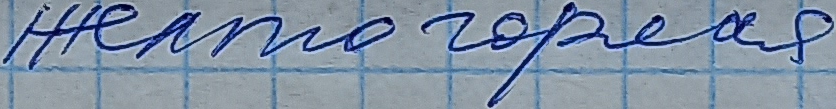желтогорлая
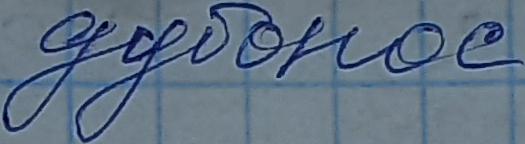дубонос
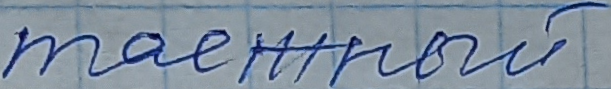таежный
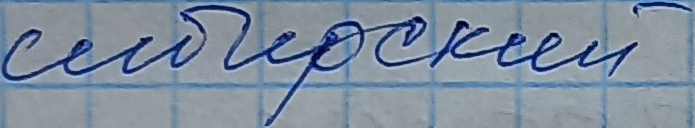сибирский
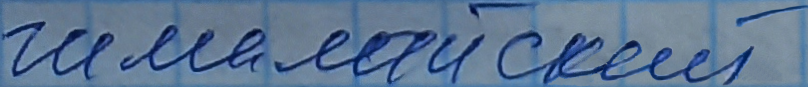гималайский
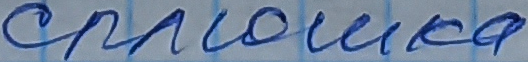сплюшка
